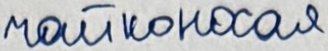чайконосая
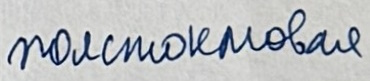полстоклювая
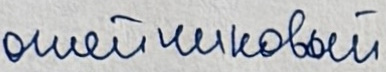ошейниковый
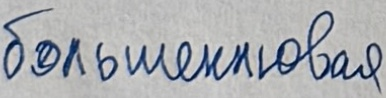большеклювая
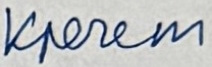кречет
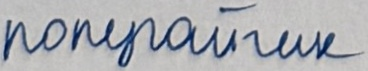попугайчик
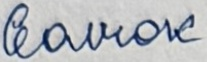волчок
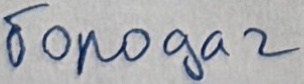бородач
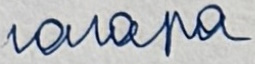гагара
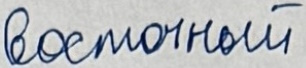восточный
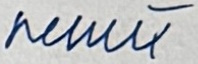пегий
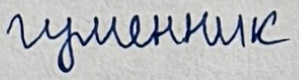гуменник
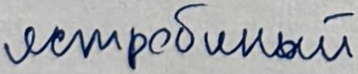ястребиный
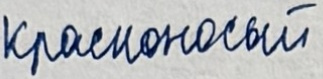красноносый
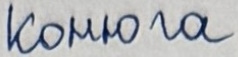конюга
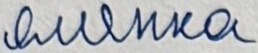оляпка
